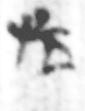○（左）
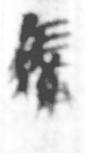○（服）
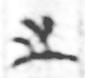之
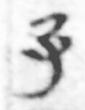子（牸）
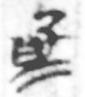爲
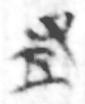○（右）
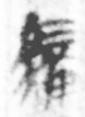○（服）
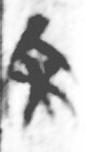宋
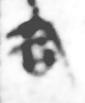司
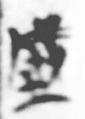城
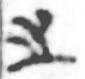之
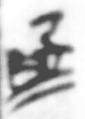爲
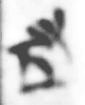○（右）
